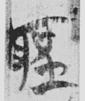聖（聼）
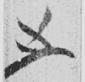之
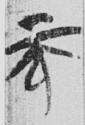而
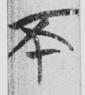不
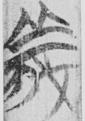義
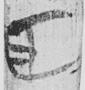耳
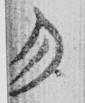勿
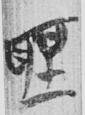聖（聼）
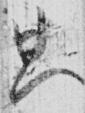也
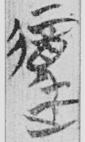○（動）
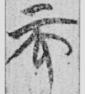而
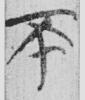不
